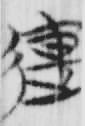連
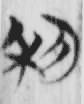利（利）
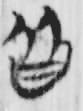皆
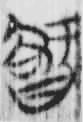智（知）
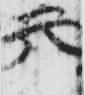亓（其）
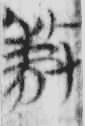殺
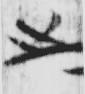之
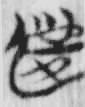○（僕）
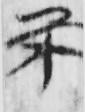不
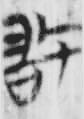敢
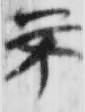不
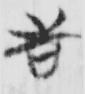告
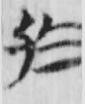於
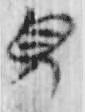視
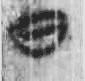日
